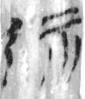𫵖
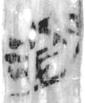朔
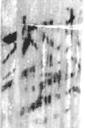室營
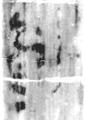○（夏）
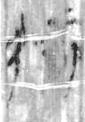𫵖
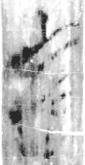○（奎）
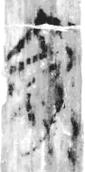亯（享）
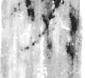月
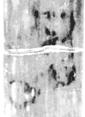胃
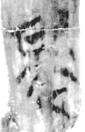○（夏）
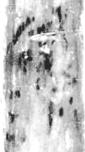罼（畢）
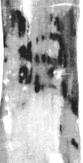八月
